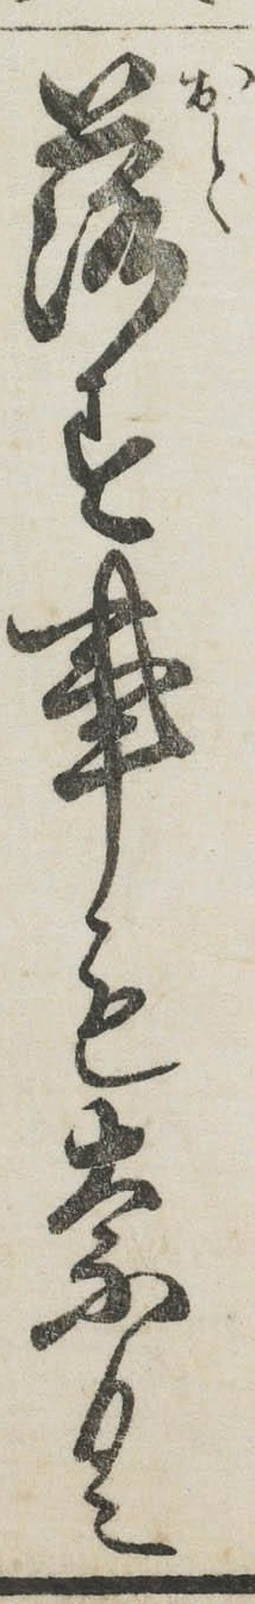落す事もなく
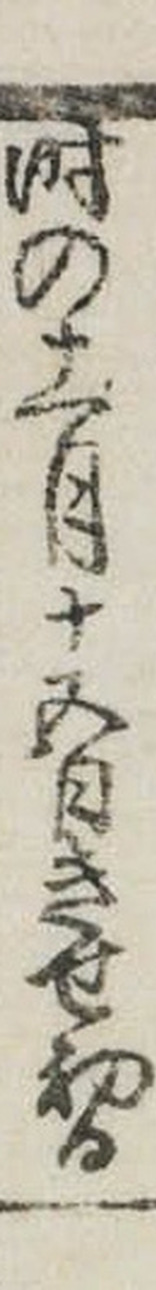時の十一月十五日きせ初る
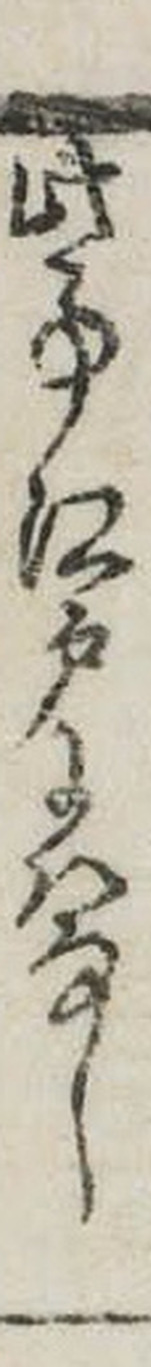此事江戸にはなし
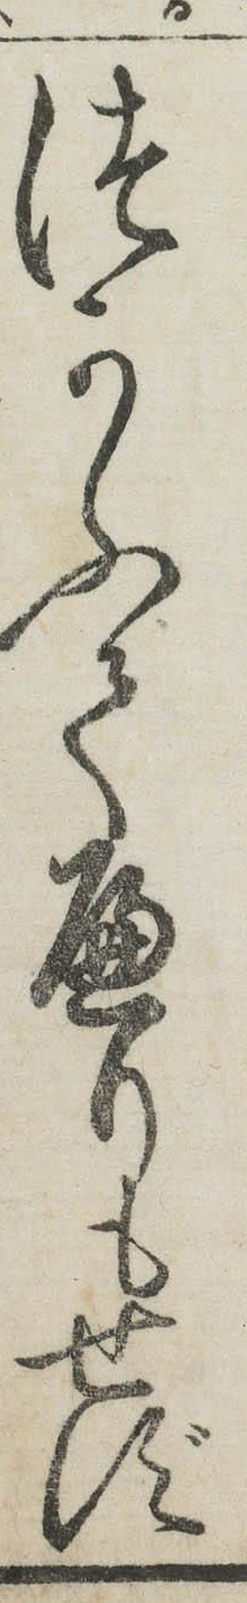つかふてへりもせず
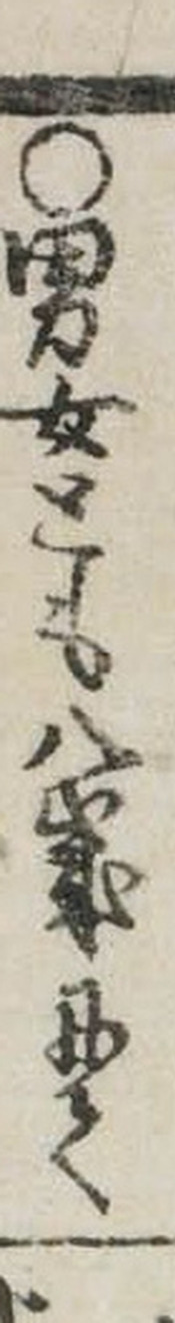○男女とも八歳にて
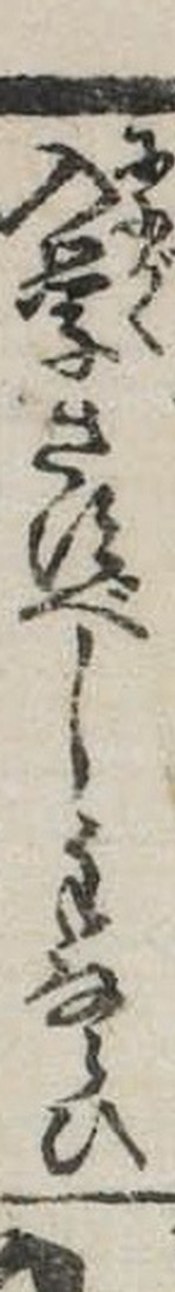入学さすべし手ならひ
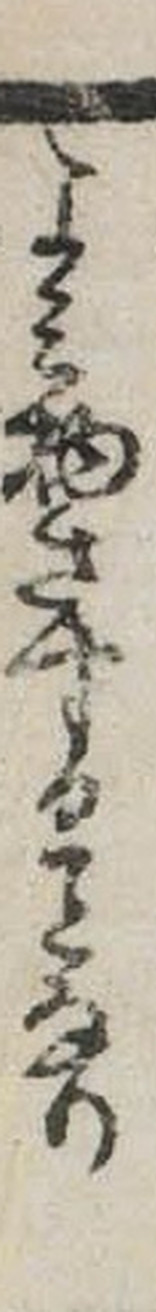よみ物さすることなり
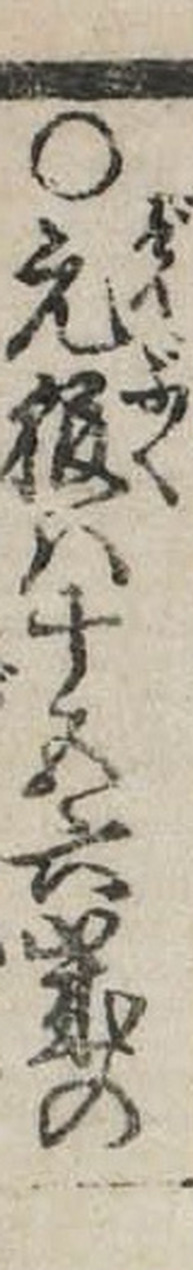○元服は十五六歳の
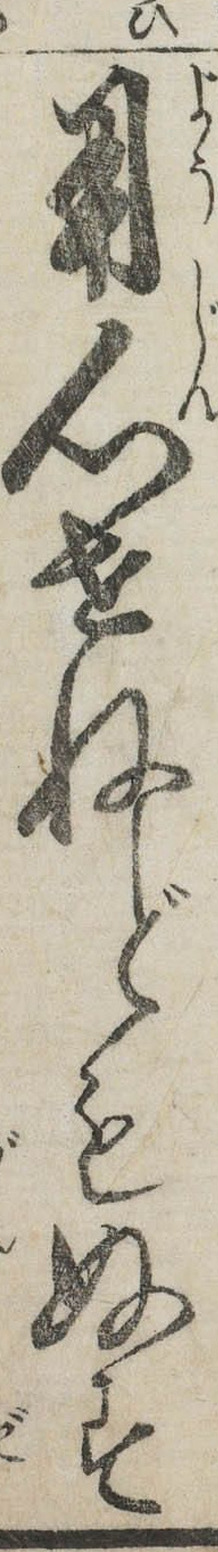用心せねどもぬす
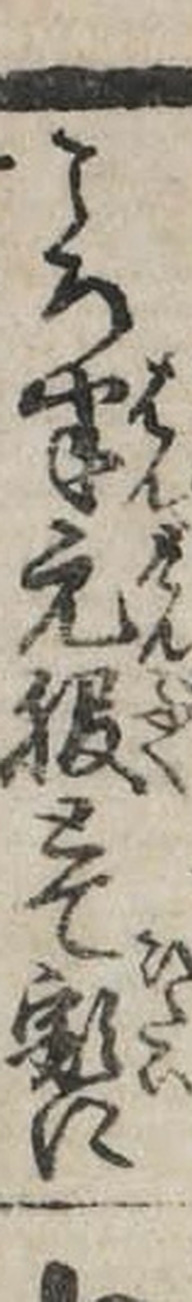ころ半元服とて額に
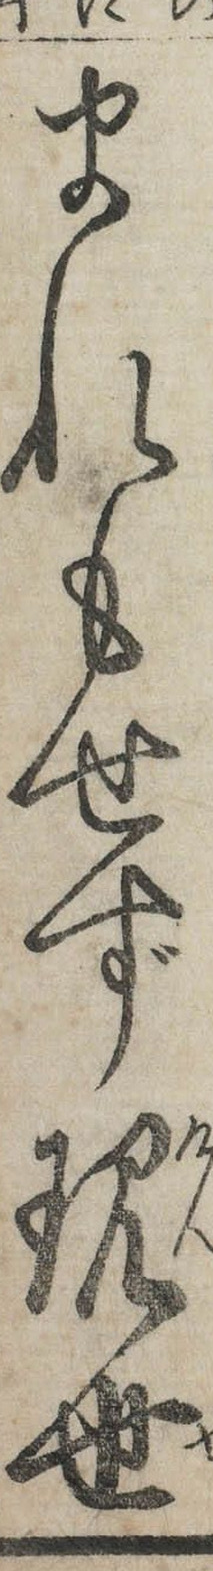まれもせず現世
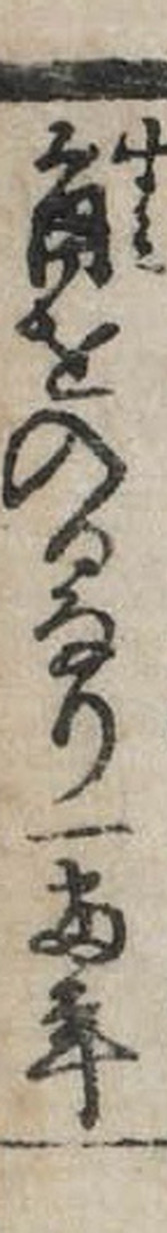角を入るなり一両年

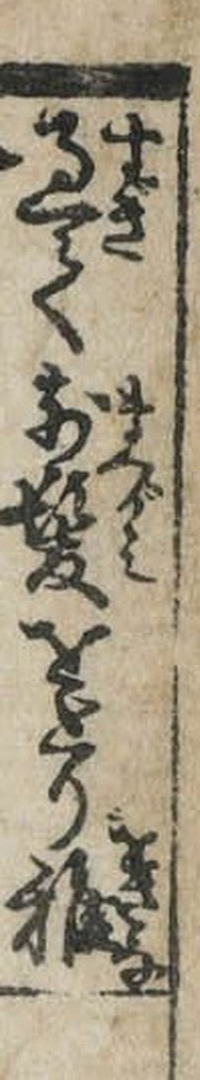過て前髪をとり稚
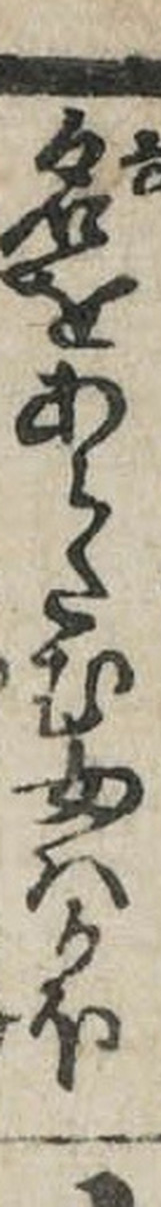名をあらたむ女はかほ
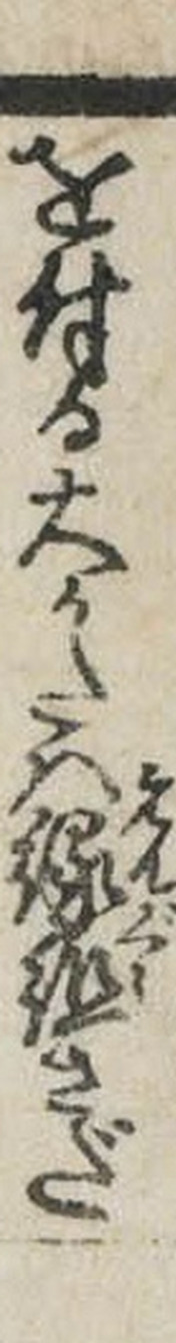を付る大かたは縁組さだ
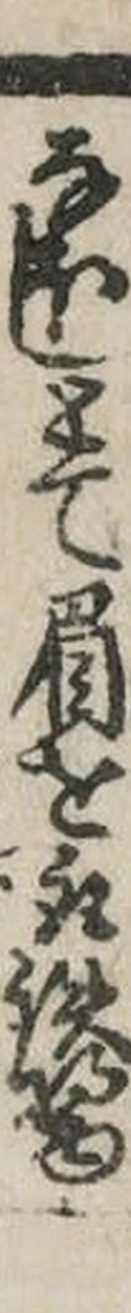なほしとて眉を取鉄醤
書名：頭書萬用婦人手紙之文言
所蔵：東京学芸大学教育コンテンツアーカイブ
